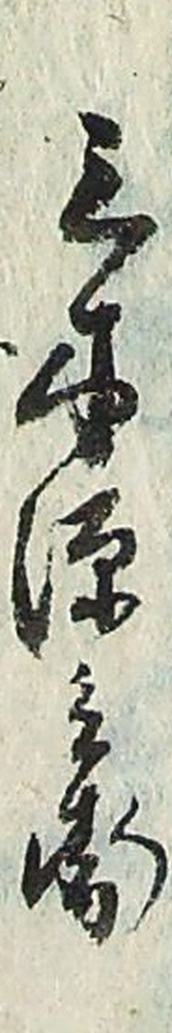三木源兵衛
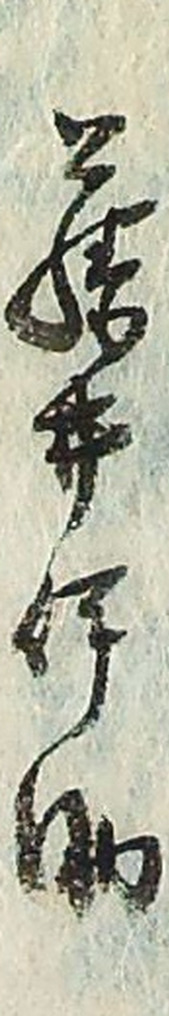藤井伊助
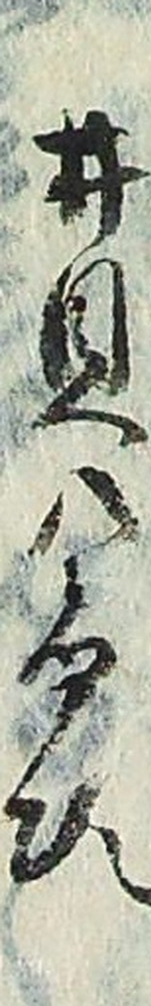井貝八郎次
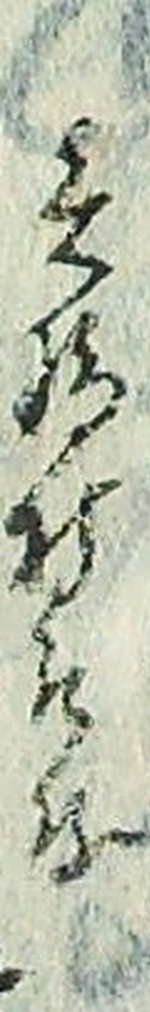矢野村庄屋
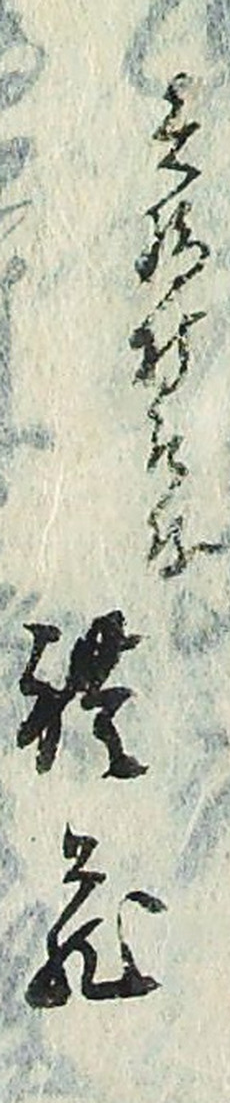矢野村庄屋
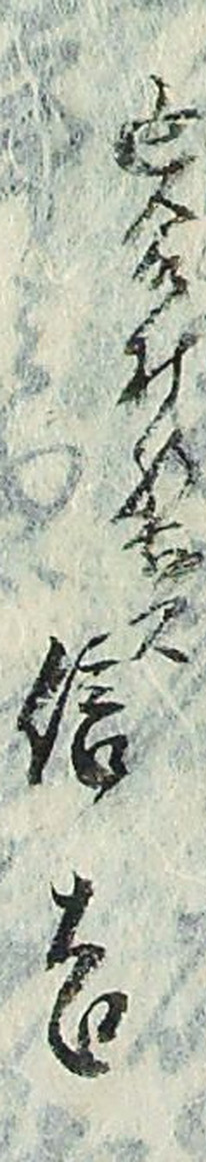延命村肝煎
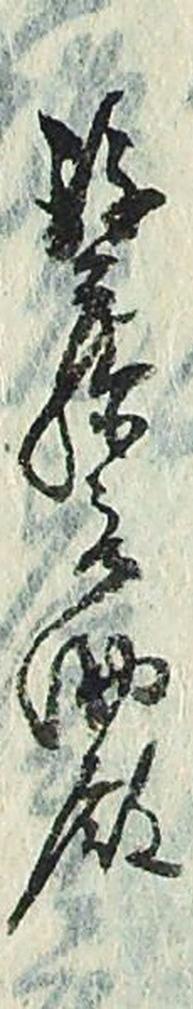後藤庄助殿
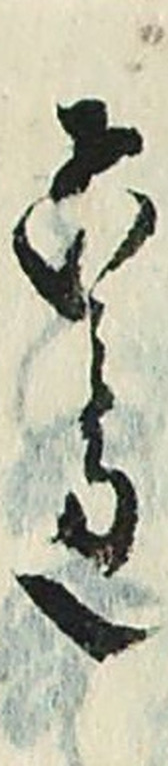右之通
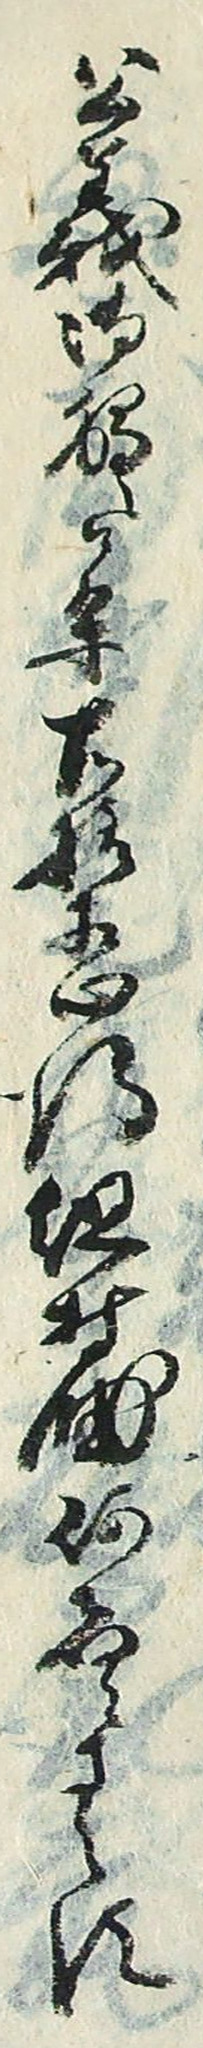公義御触に候条右様相心得組村浦何者によらす

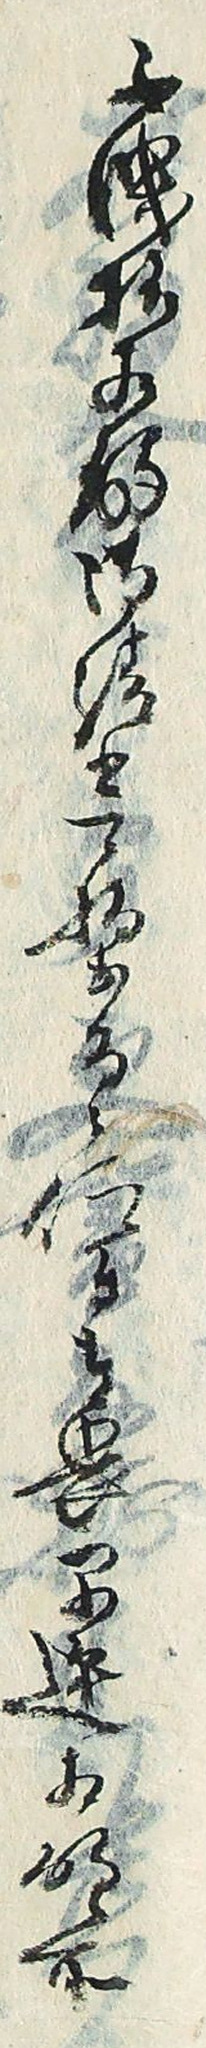不洩様相触御請書可指出旨被仰付奉畏早速相触候所
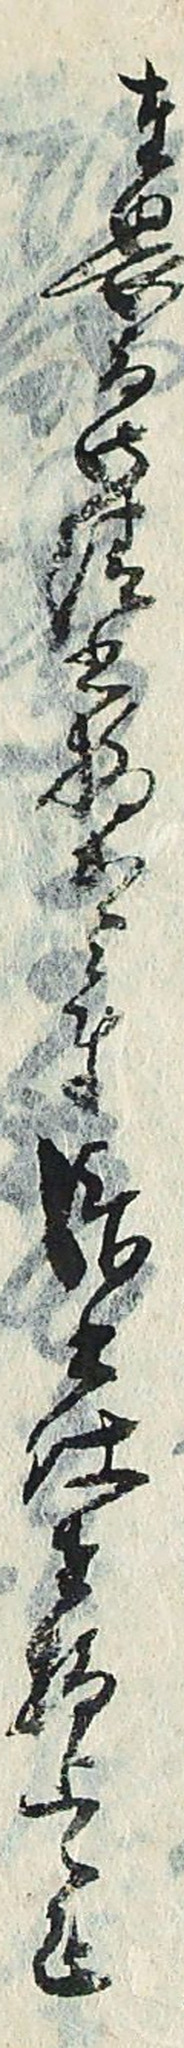奉畏旨御請書指出候に付添書仕奉指上候以上
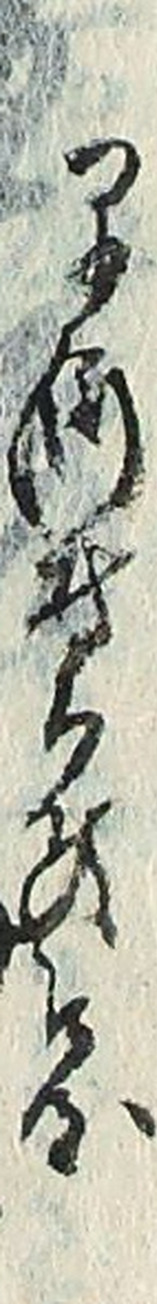早淵村与頭庄屋
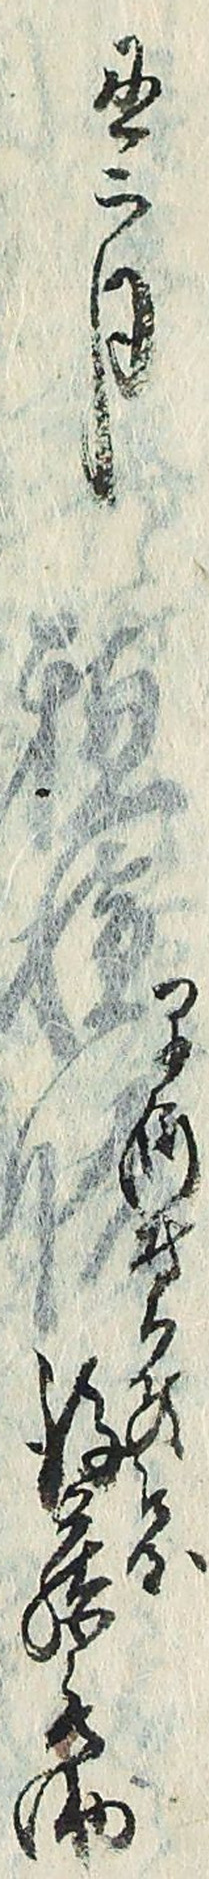丑二月後藤庄助
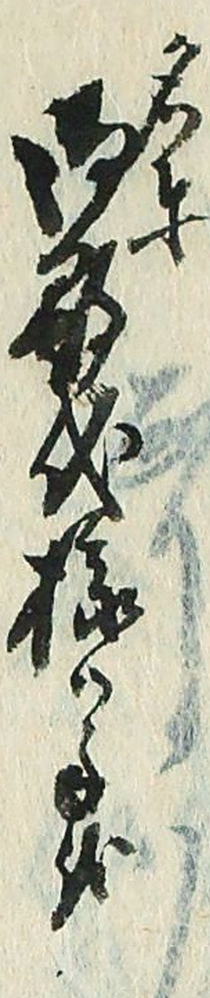御郡代様御手代
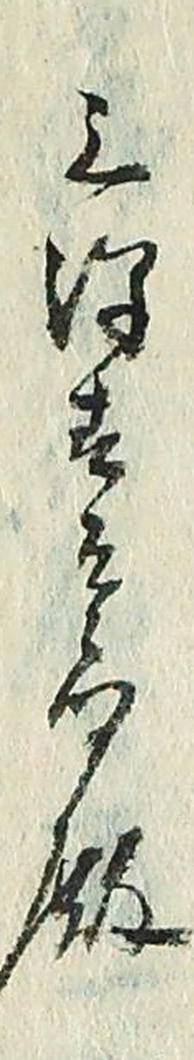三沢春太郎殿
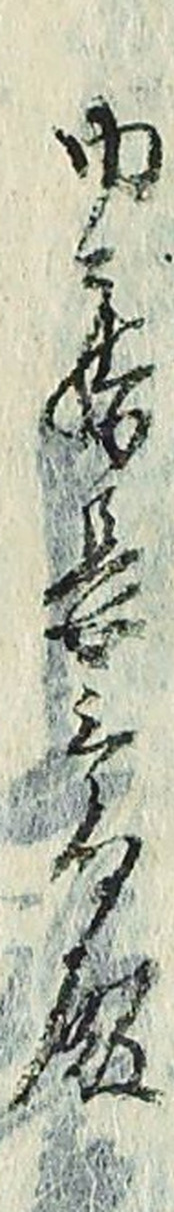内藤長三郎殿
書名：諸御用御□受書控
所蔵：鳴門教育大学 Naruto University of Education
